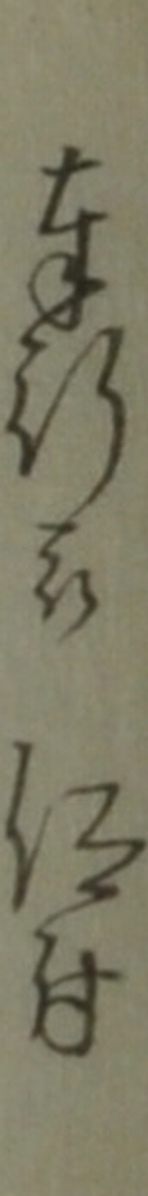奉行被仰付
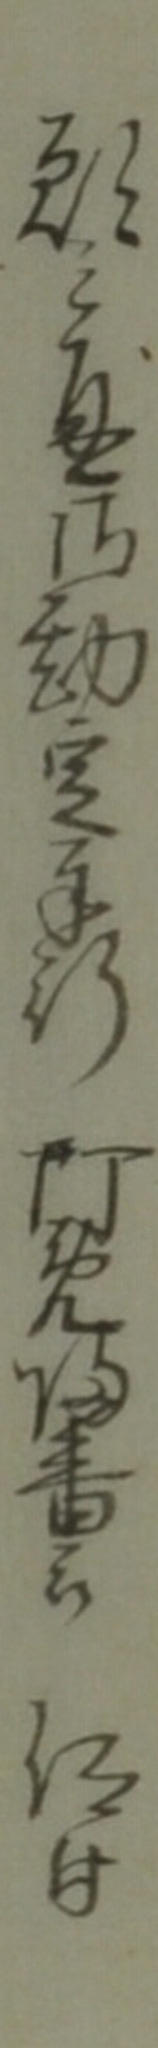願之通御勘定奉行御免帰番被仰付
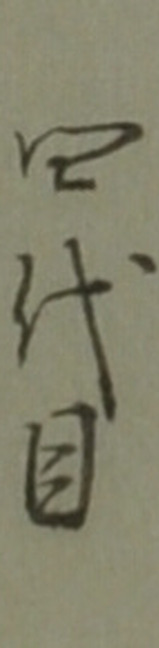四代目
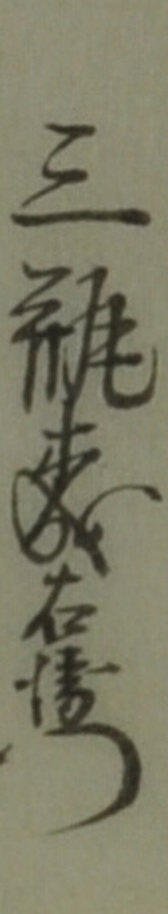三瓶森右衛門
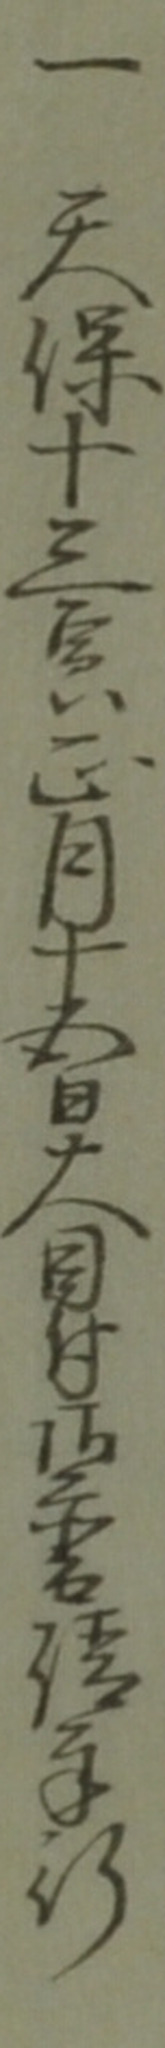一天保十三寅正月十五日大目付御普請奉行
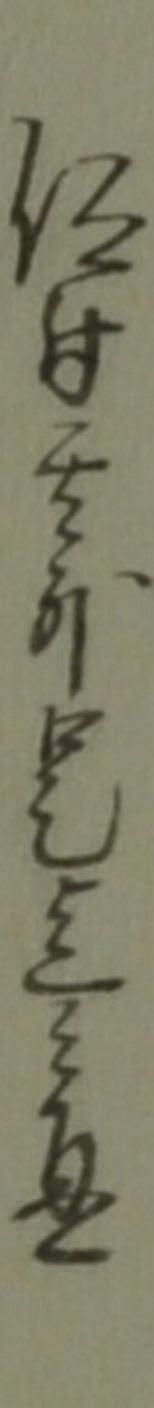仰付其外是迄之通
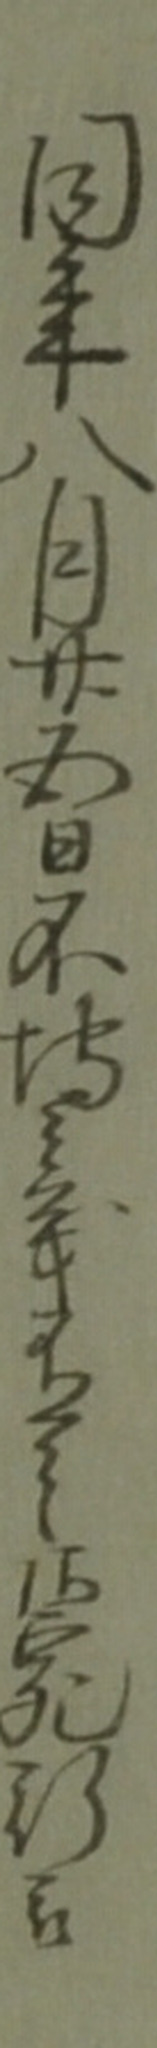一同年八月廿五日不埒之義有之御宛行被
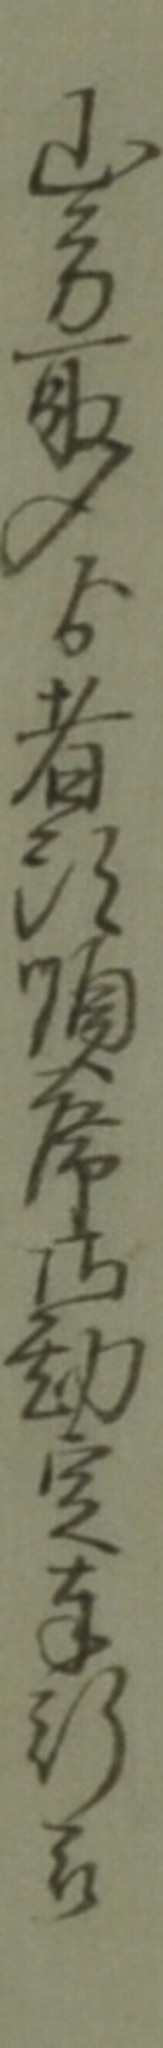山方取〆ゟ者頭順席御勘定奉行被
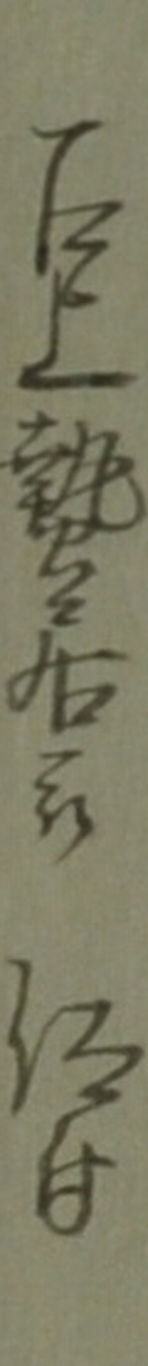召上蟄居被仰付
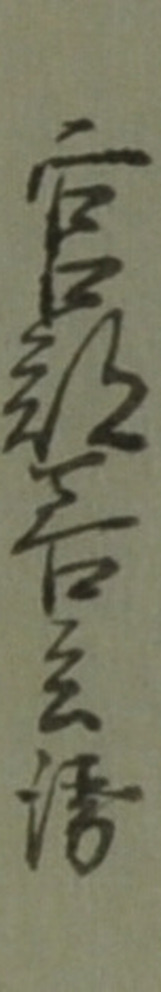宮部善兵衛
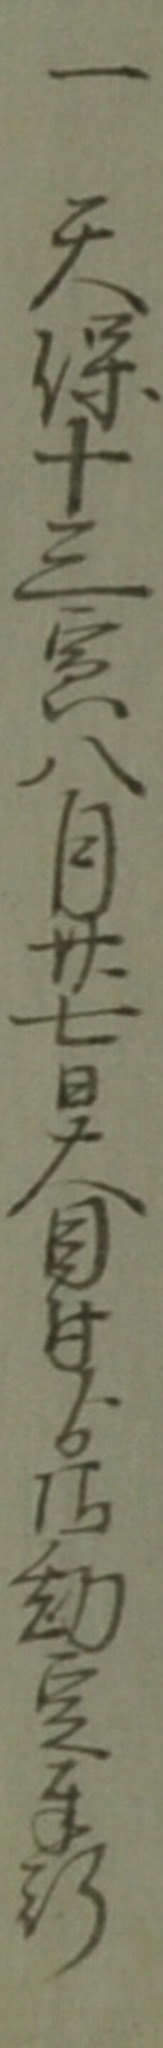一天保十三寅八月廿七日大目付ゟ御勘定奉行
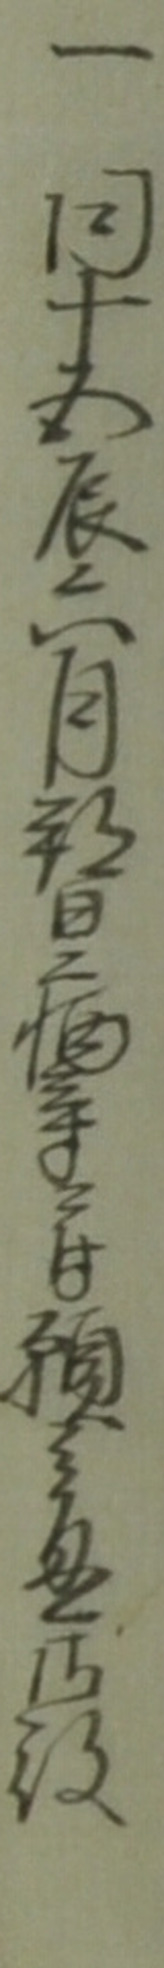一同十五辰六月朔日病気ニ付願之通御役
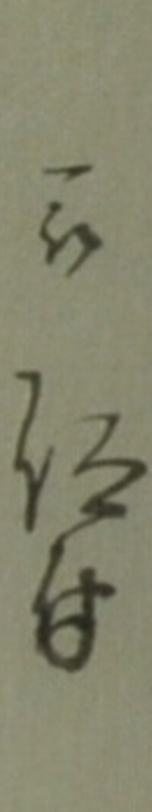被仰付

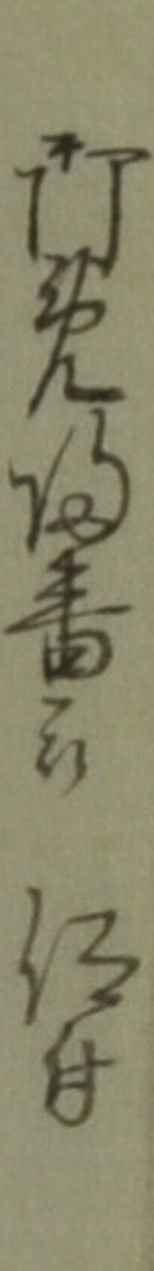御免帰番被仰付
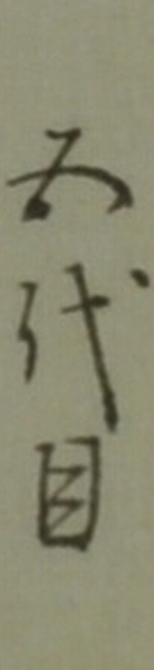五代目
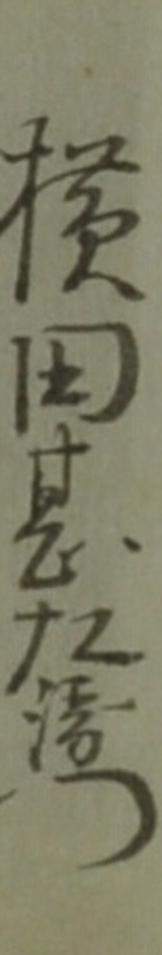横田甚左衛門
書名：諸御役代々録（三）
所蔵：伊那市立高遠町図書館・合同会社AMANE
